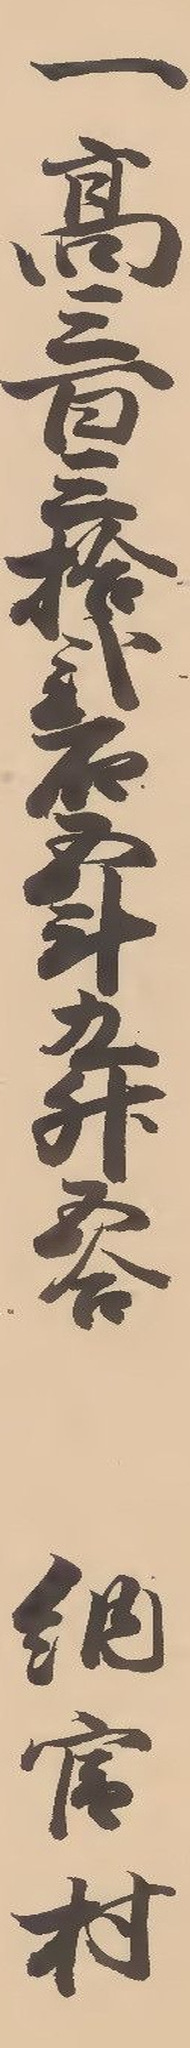一高三百三拾弐石五斗九升五合納官村
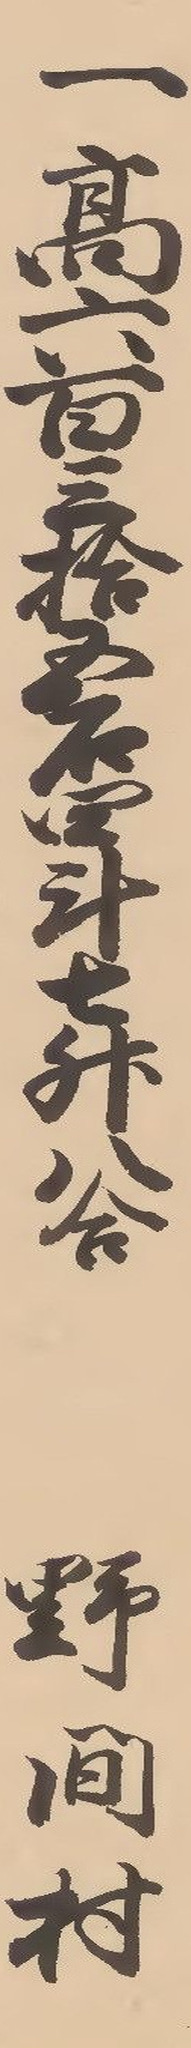一高六百三拾五石四斗七升八合野間村
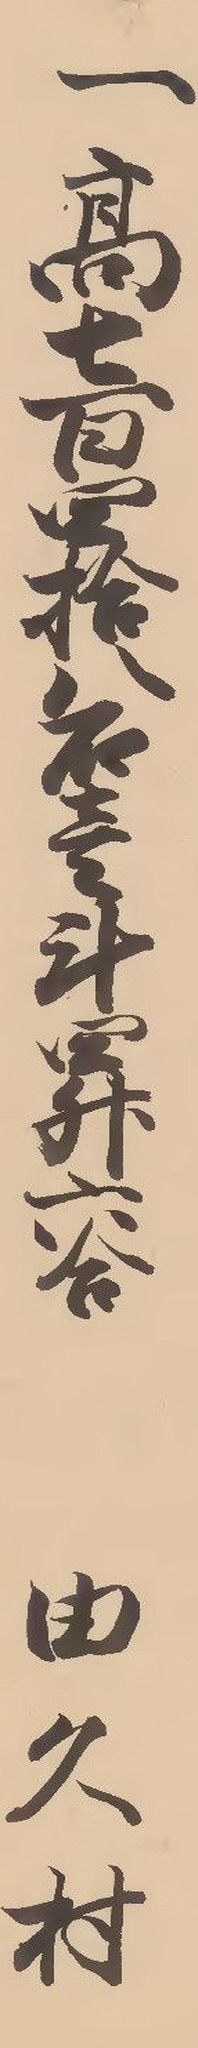一高七百四拾八石壱斗四升六合由久村
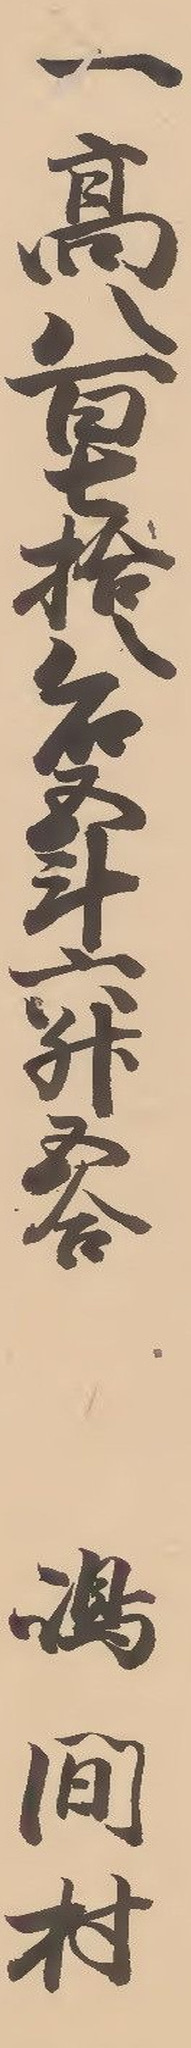一高八百七拾八石五斗六升五合島間村
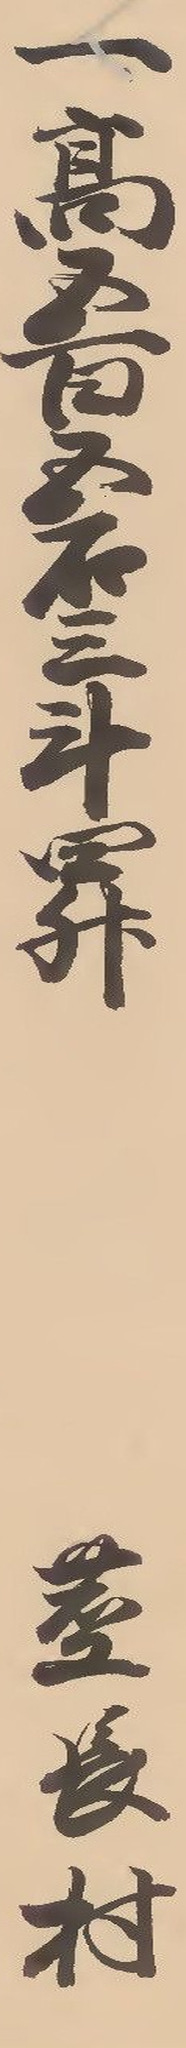一高五百五石三斗四升茎長村
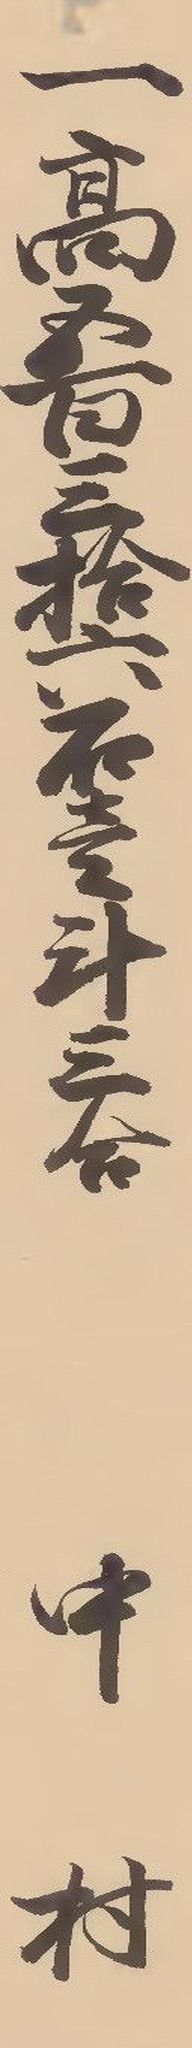一高五百三拾六石壱斗三合中村
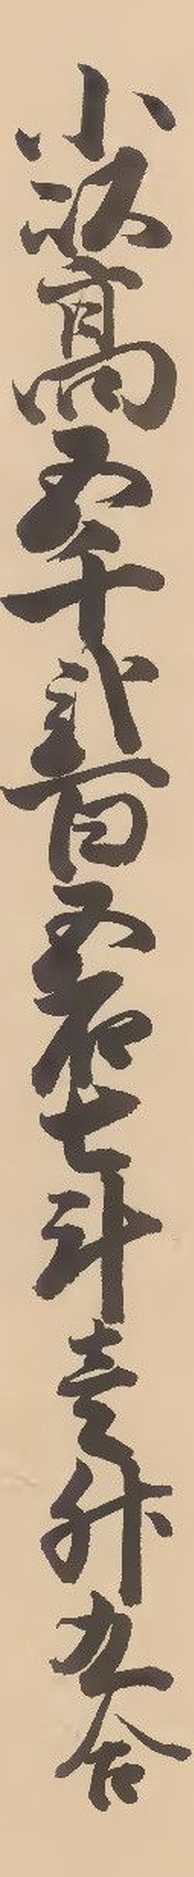小以高五千弐百五石七斗壱升九合

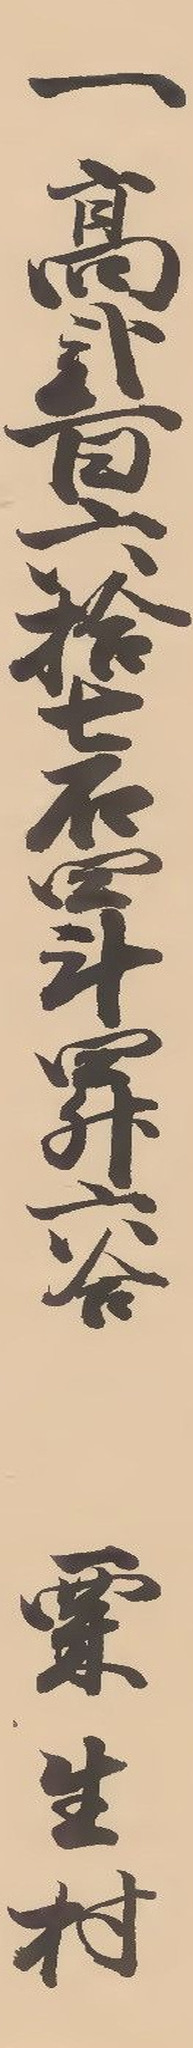一高弐百六拾七石四斗四升六合栗生村
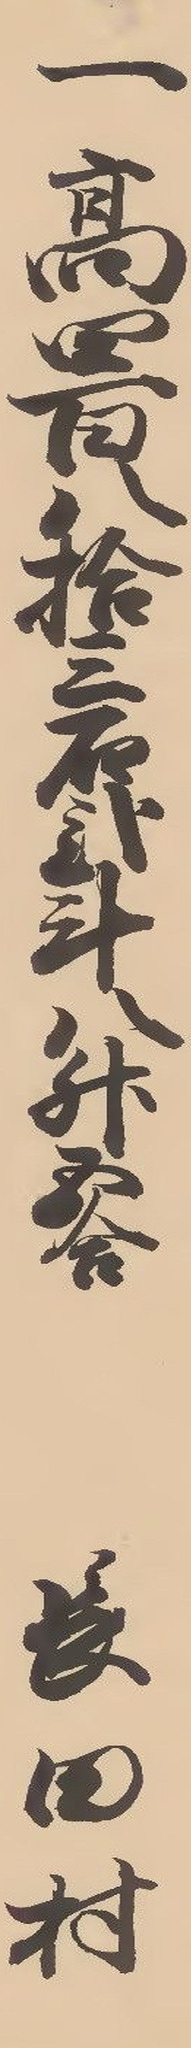一高四百八拾三石弐斗八升五合長田村
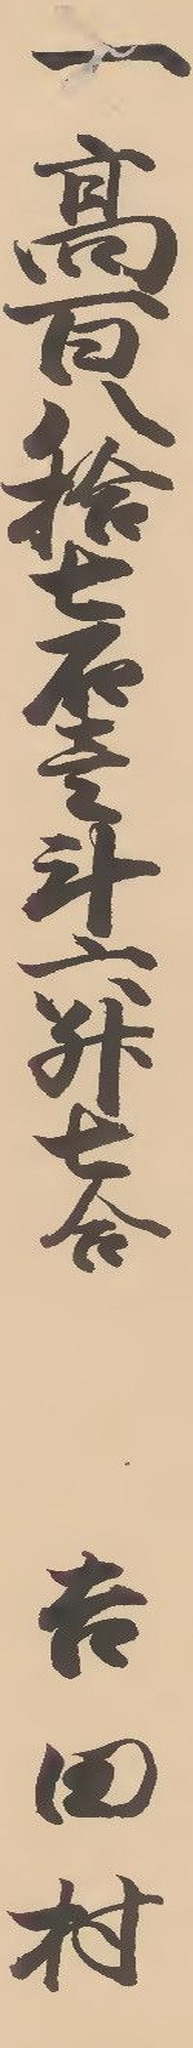一高百八拾七石壱斗六升七合吉田村
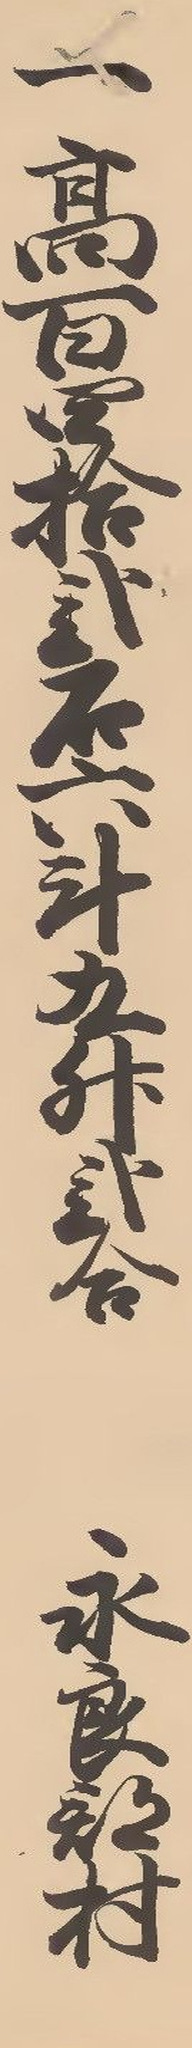一高百四拾弐石六斗九升弐合永良部村
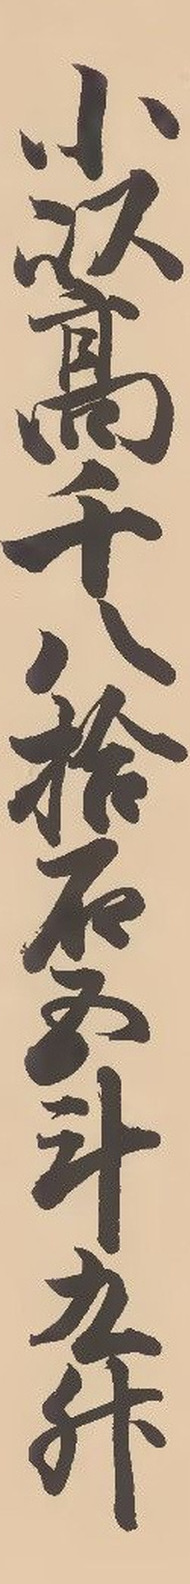小以高千八拾石五斗九升

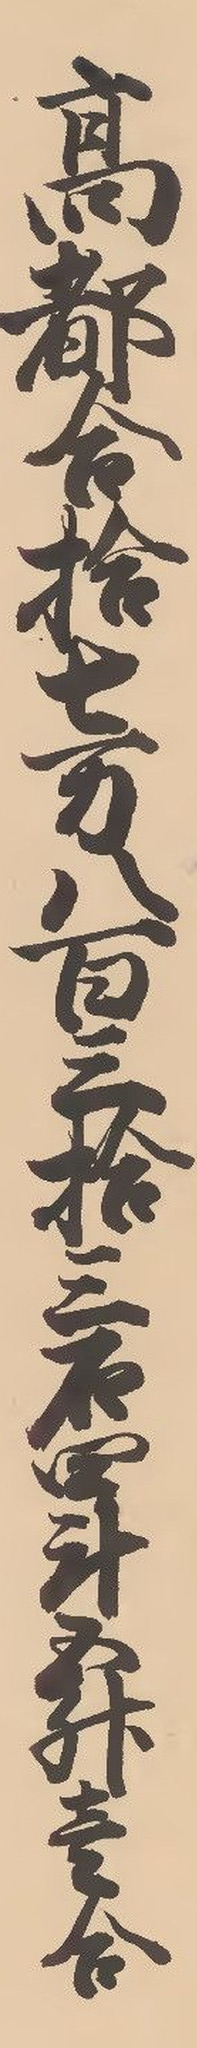高都合拾七万八百三拾三石四斗五升壱合
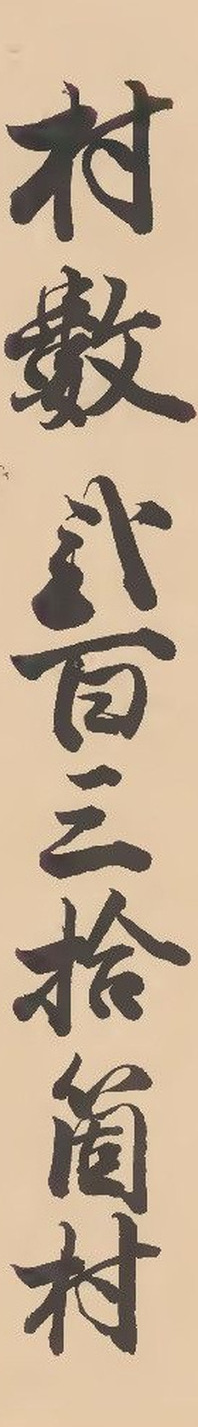村数弐百三拾箇村
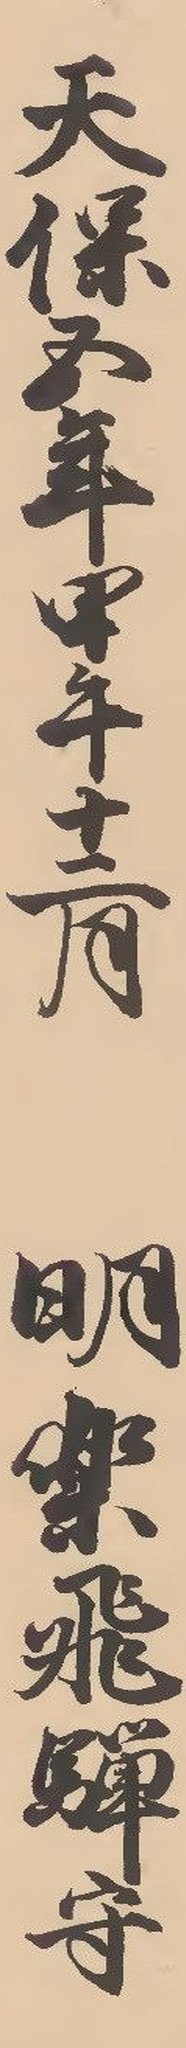天保五年甲午十二月明楽飛騨守
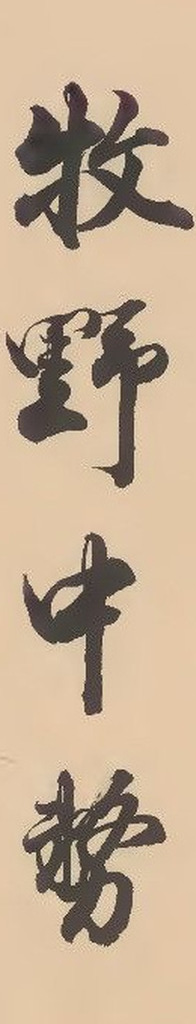牧野中務
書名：大隅国郷帳
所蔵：国立公文書館 National Archives of Japan
